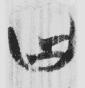曰
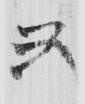又
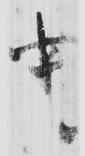才
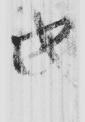女
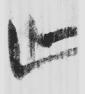亡
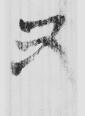又
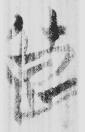良
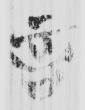言
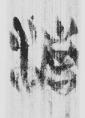清
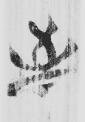至
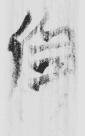於
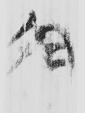今
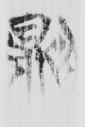則
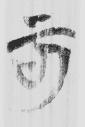可
